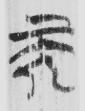而
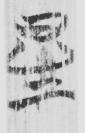星
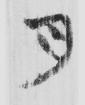月
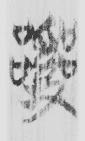{𤔔㗊}
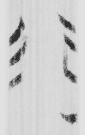行
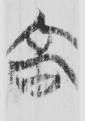高
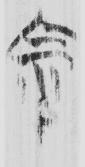宗
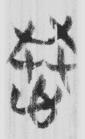恭
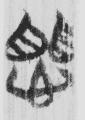愳
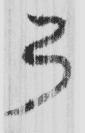乃
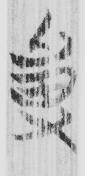尃
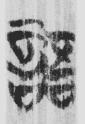語
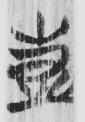彭
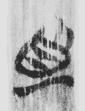且
